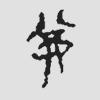{罒廾}
